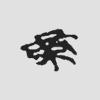帝
